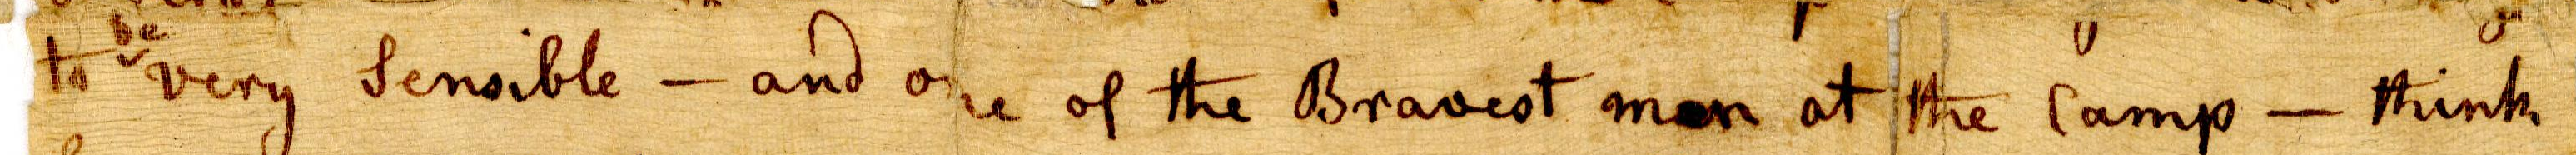to ^ very Sensible- and one of the Bravest men at the Camp- think
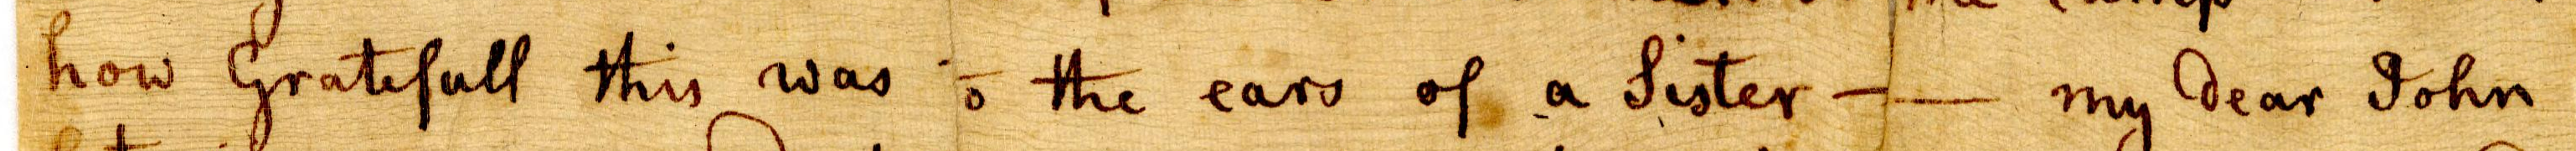how Gratefull this was [_]o the ears of a Sister- my dear John
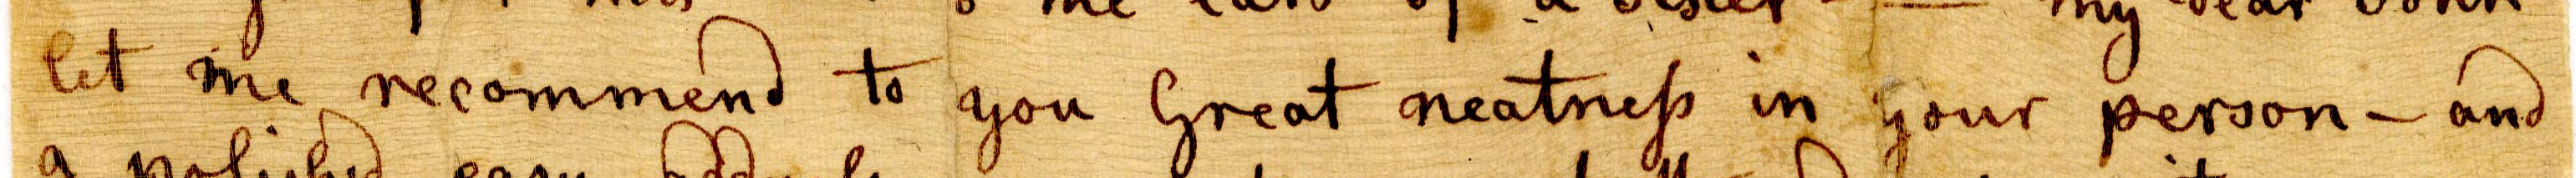let me recommend to you Great neatness in your person- and
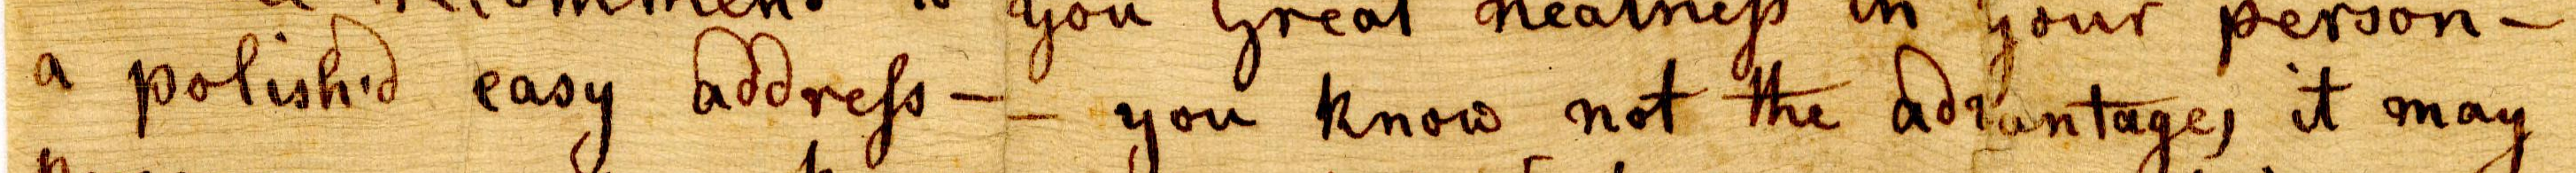a polish'd easy address- you know not the advantage, it may
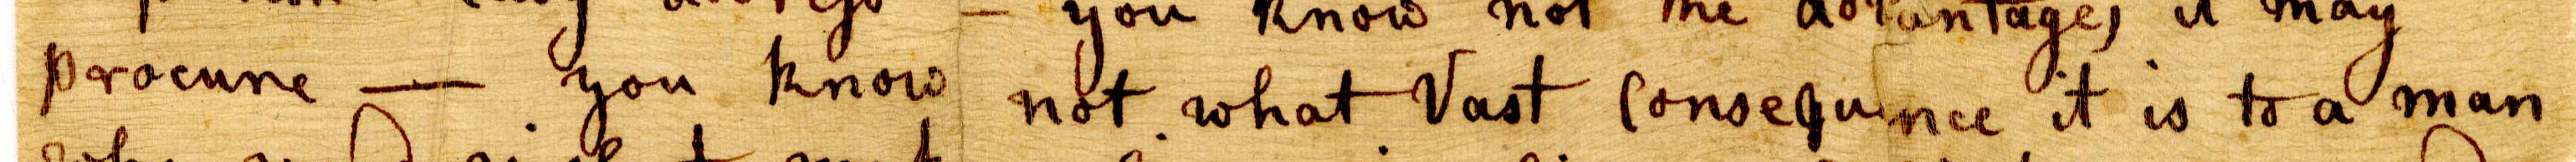procure- you know now what Vast consequence it is to a man
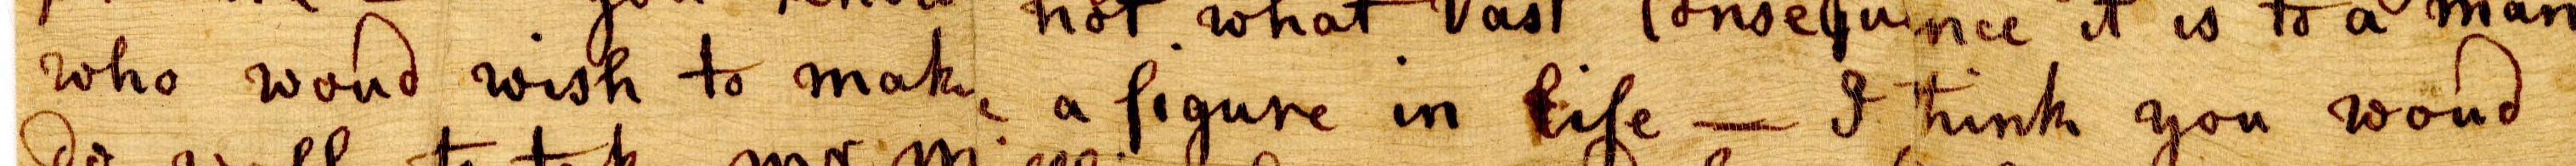who woud wish to make a figure in life- I think you would
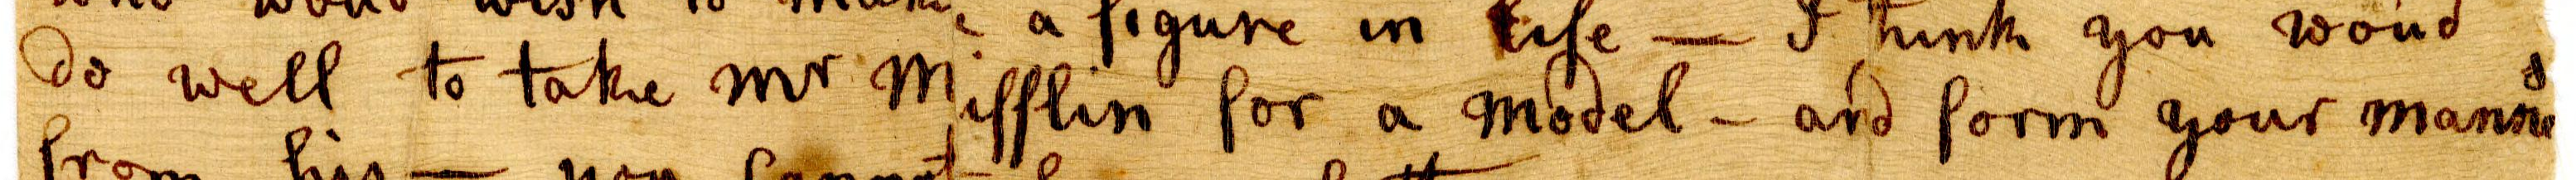do well to take M^r Mifflin for a model- and form your manner^s
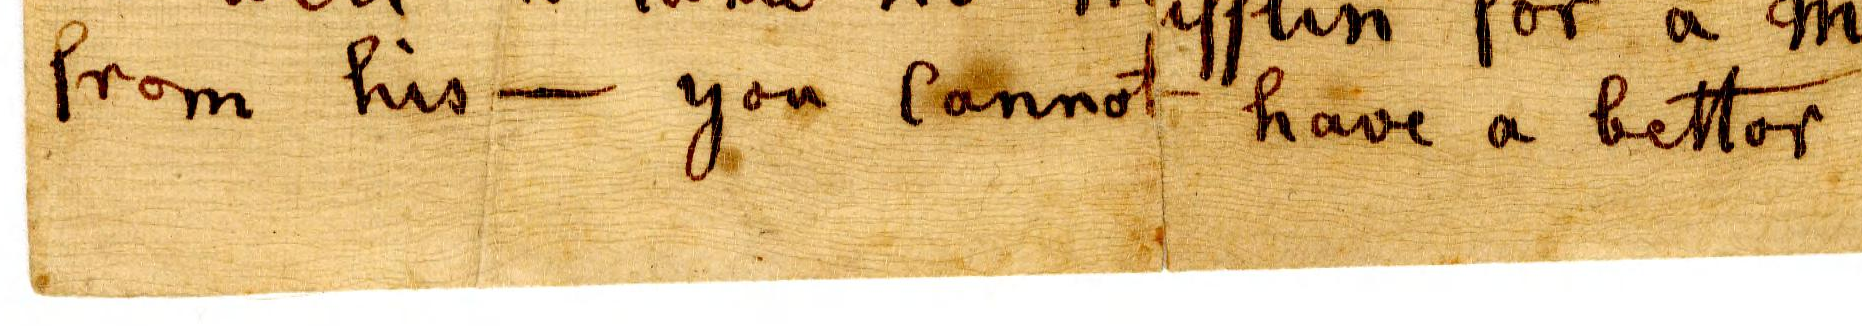from his- you Cannot have a better
